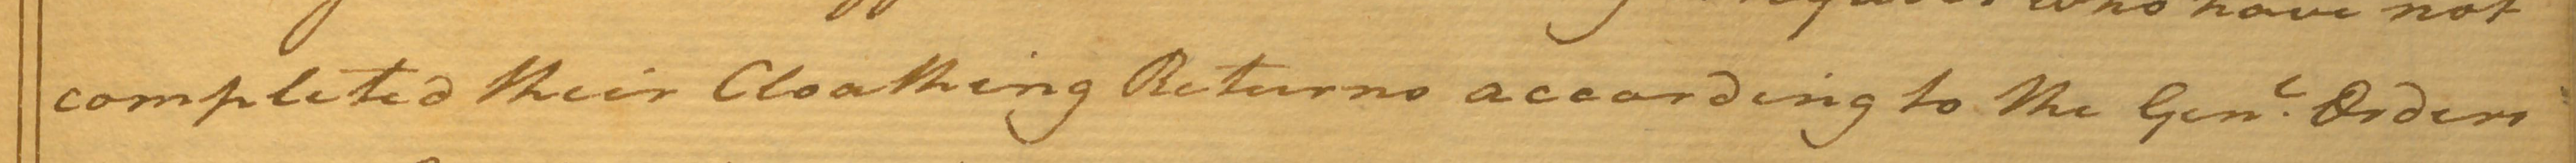completed their Cloathing Returns according to the Gen^l. Orders
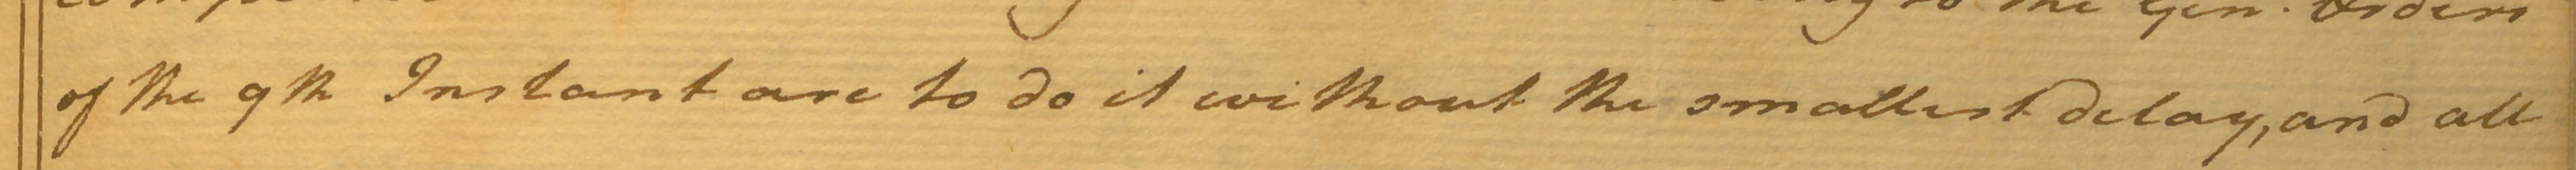of the 9^th Instant are to do it without the smallest delay, and all
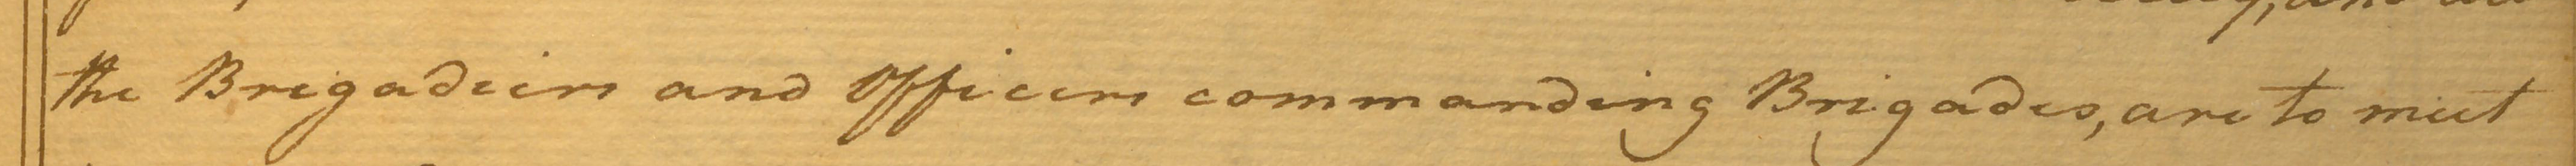the Brigadiers and Officers comamnding Brigades, are to meet
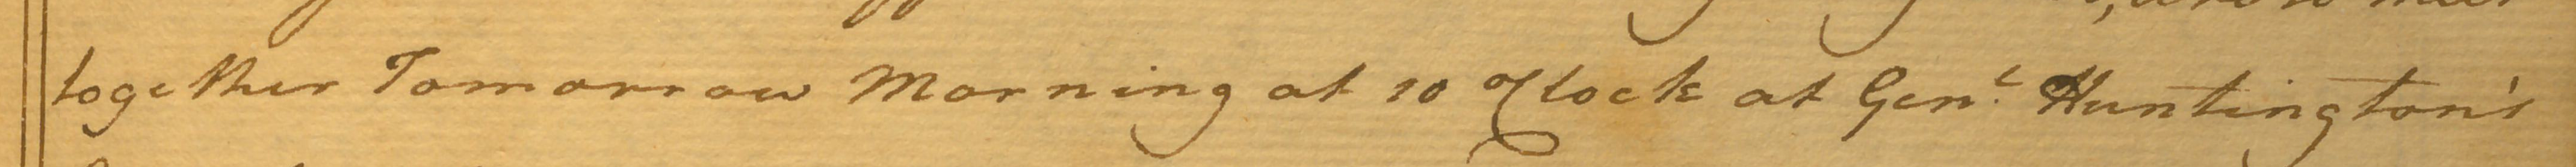together Tomorrow Morning at 10 ^oClock at Gen^l. Huntington's
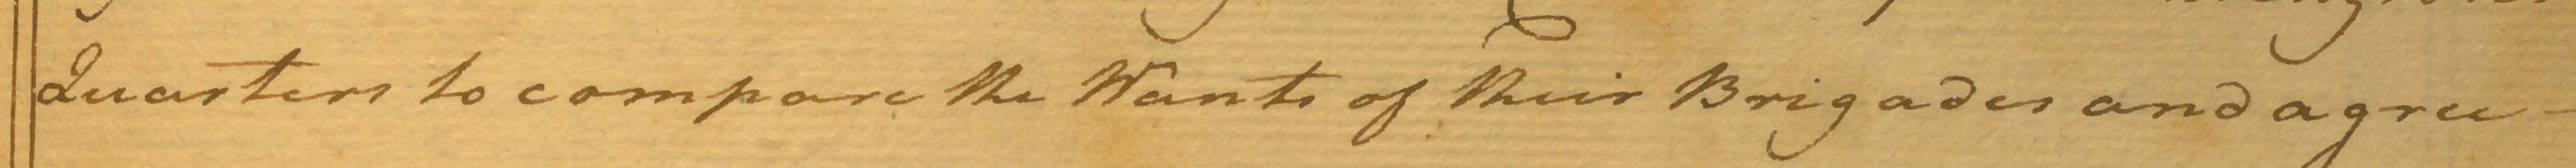Quarters to compare the Wants of their Brigades and agree
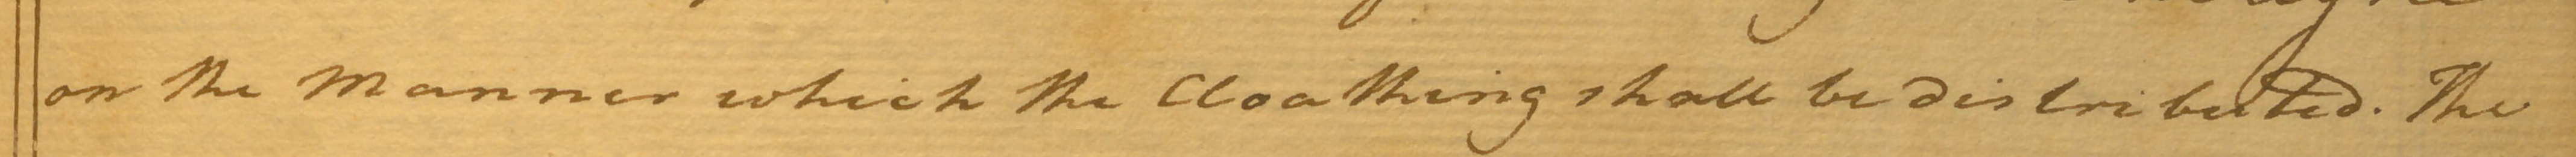on the Manner which the Cloathing shall be distributed. The
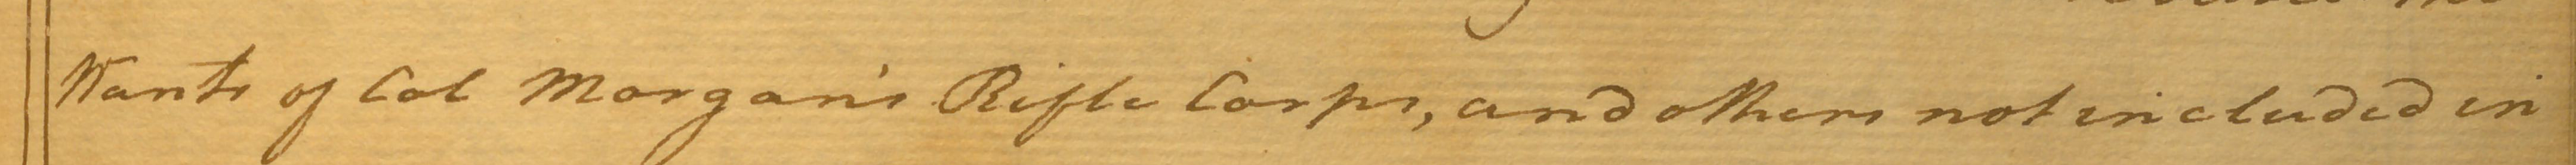Wants of Col Morgan's Rifle Corps, and others not included in
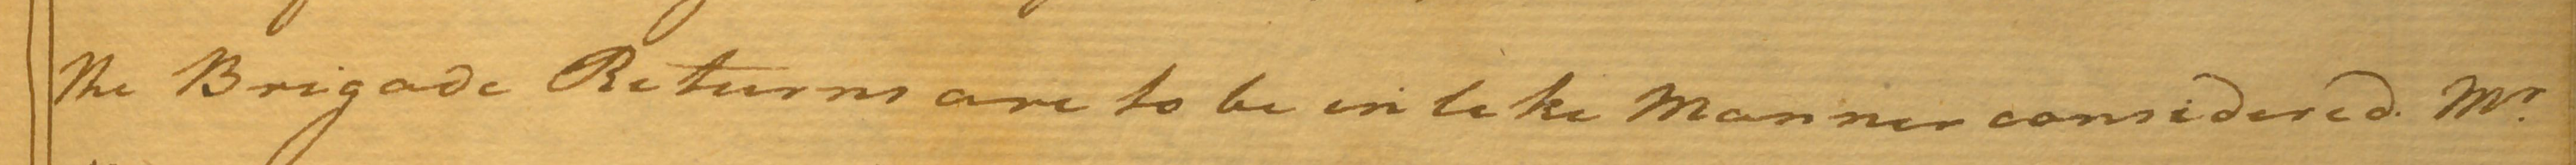the Brigade Returns are to be in like Manner considered. M^r.
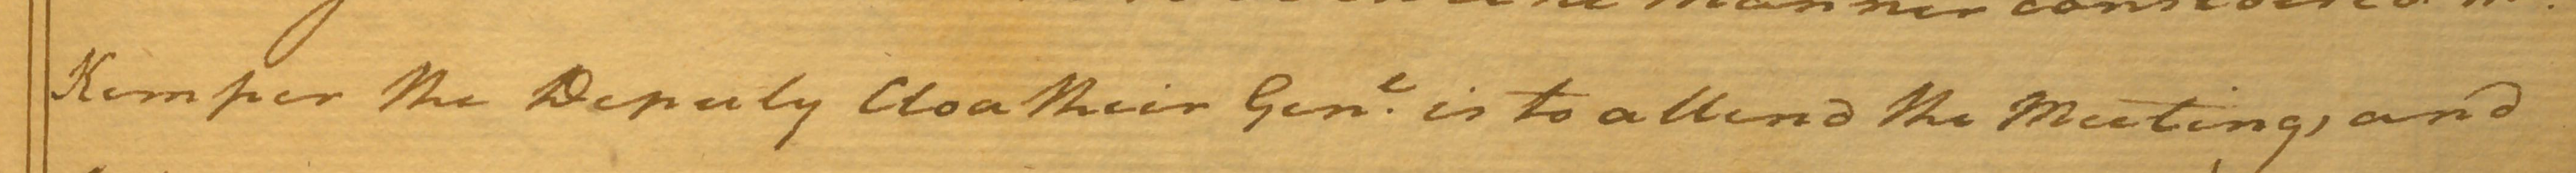Kemper the Deputy Cloathier Gen^l. is to attend the Meeting, and
